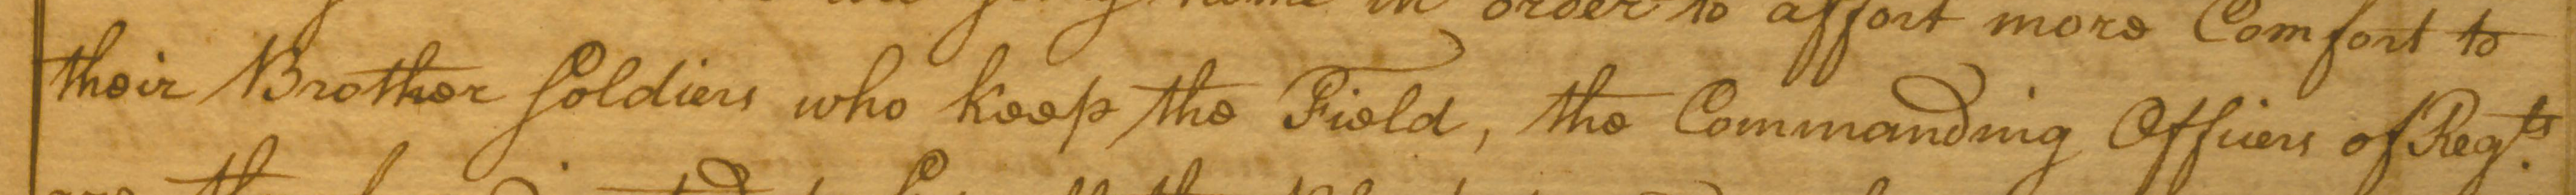their Brother soldiers who keep the Field, the Commanding Officers of Reg^ts.
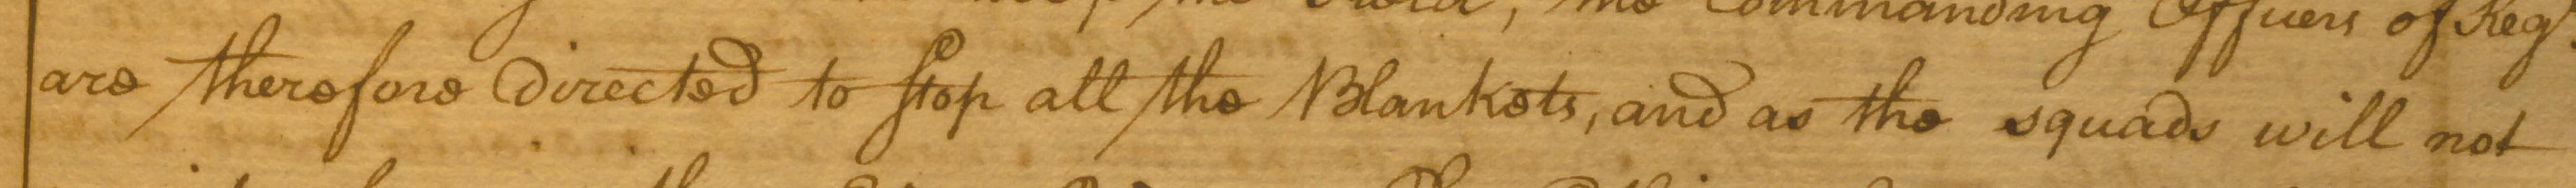are therefore directed to stop all the Blankets, and as the squads will not
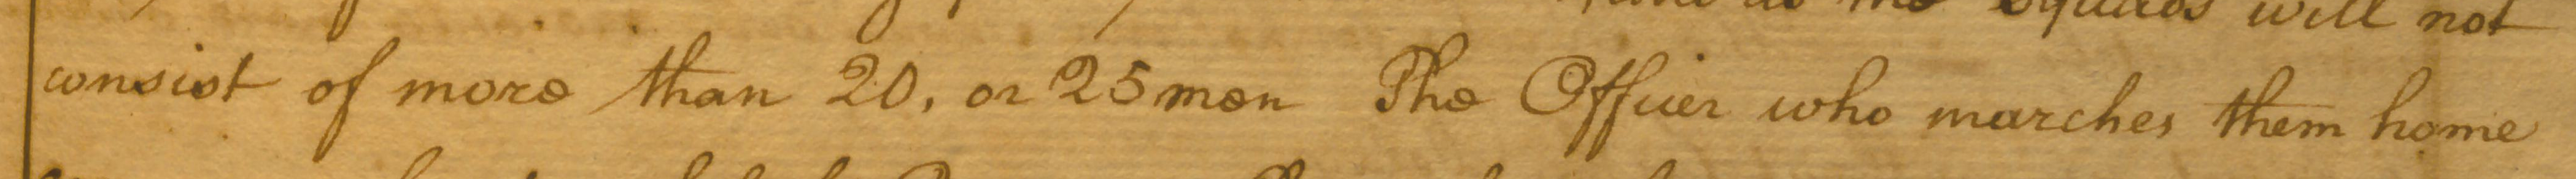consist of more than 20, or 25 men The Officer who marches them home
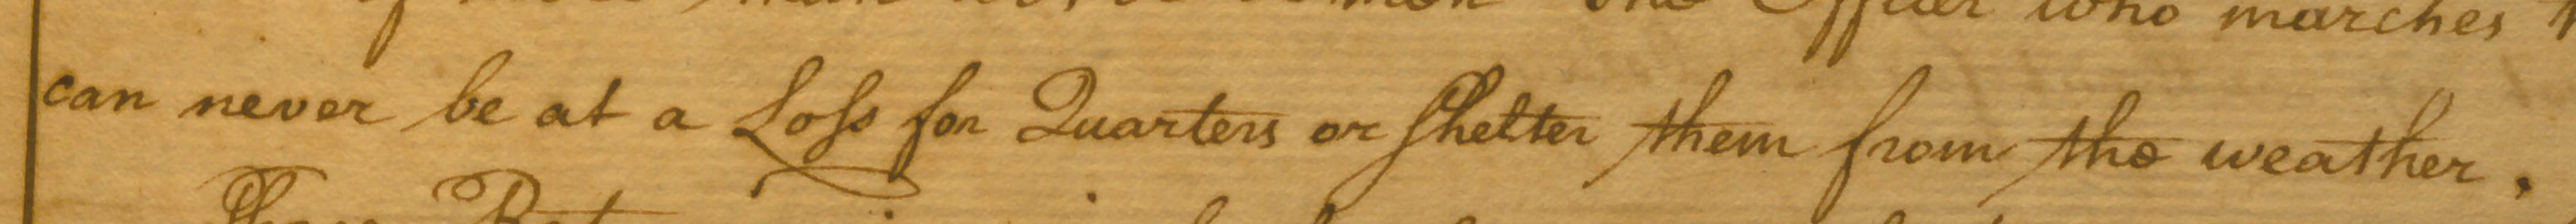can never be at a Loss for Quarters or shelter them from the weather.
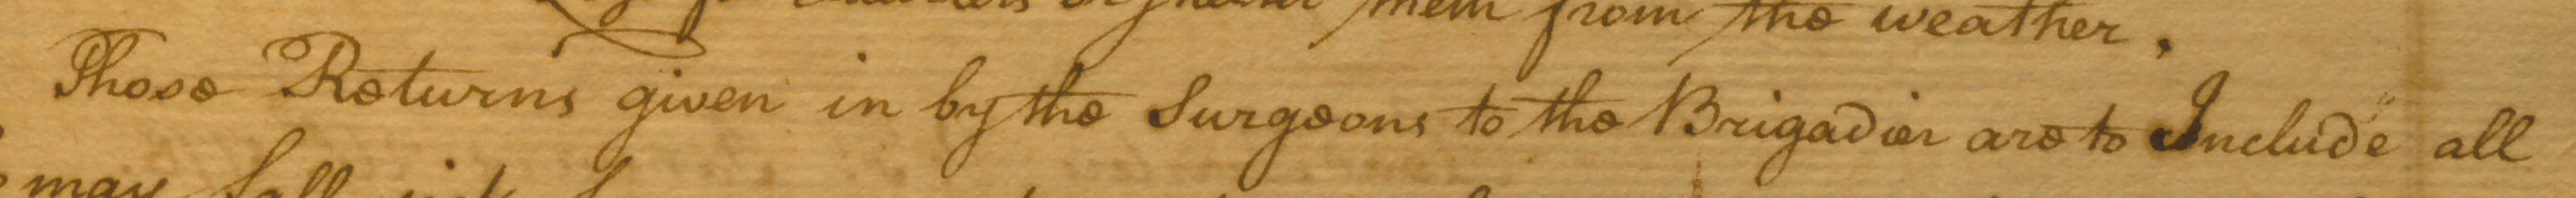Those Returns given in by the Surgeons to the Brigadier are to Include all
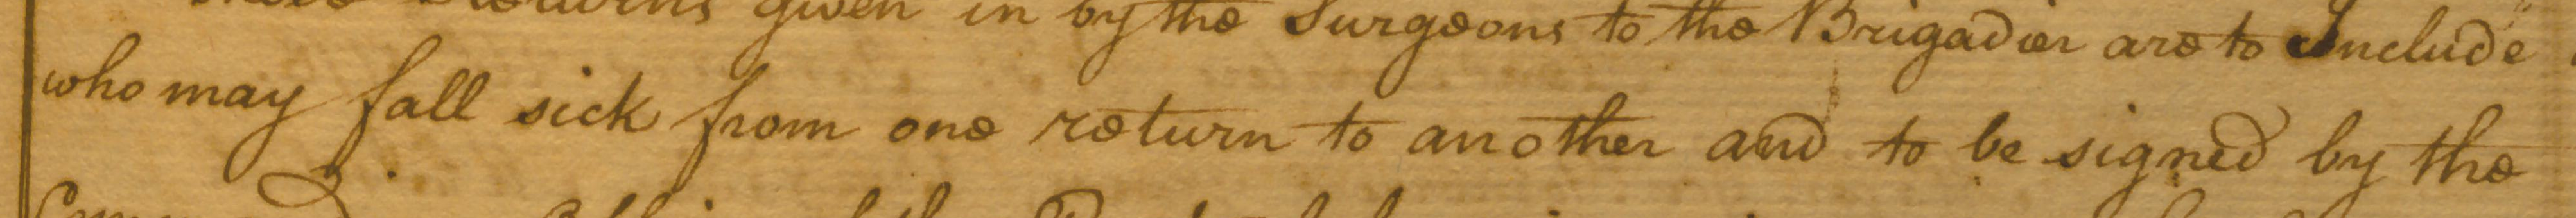who may fall sick from one return to another and to be signed by the
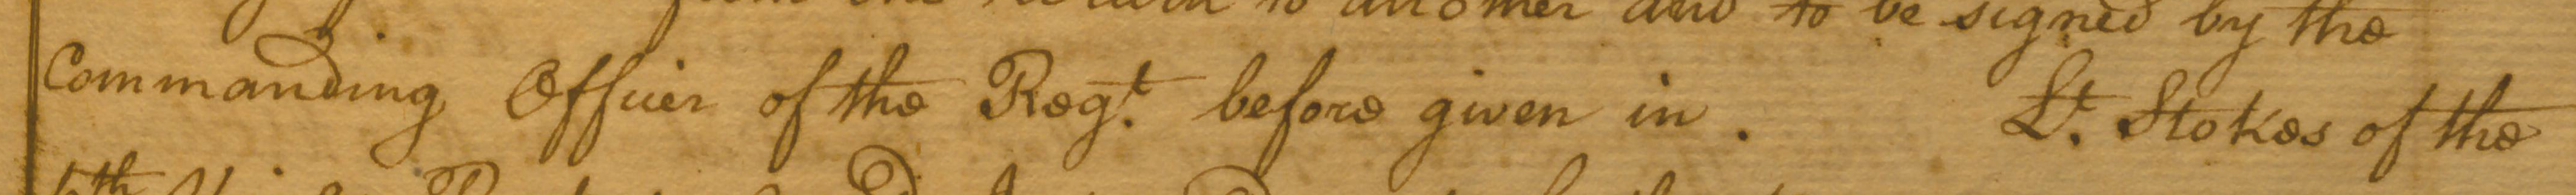Commanding Officer of the Reg^t. before given in. L^t. Stokes of the
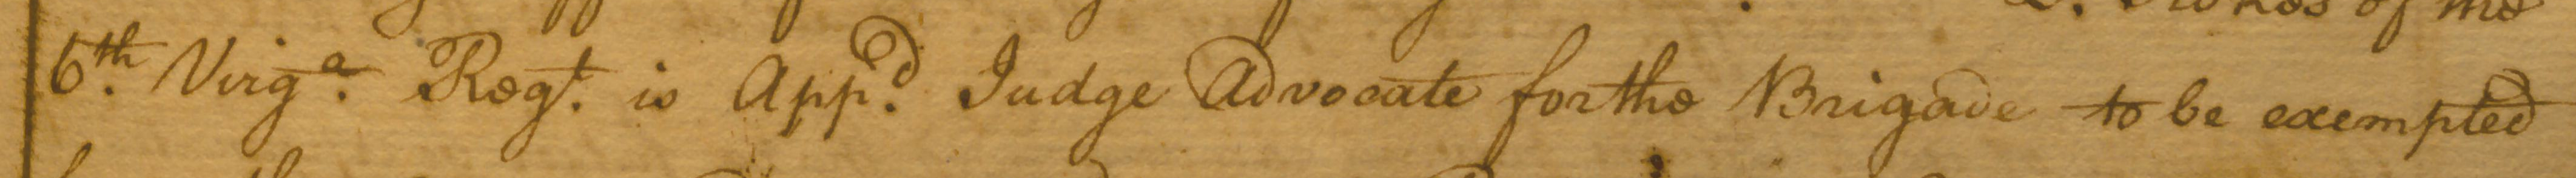6^th. Virg^a. Reg^. is App^d. Judge Advocate for the Brigade to be exempted
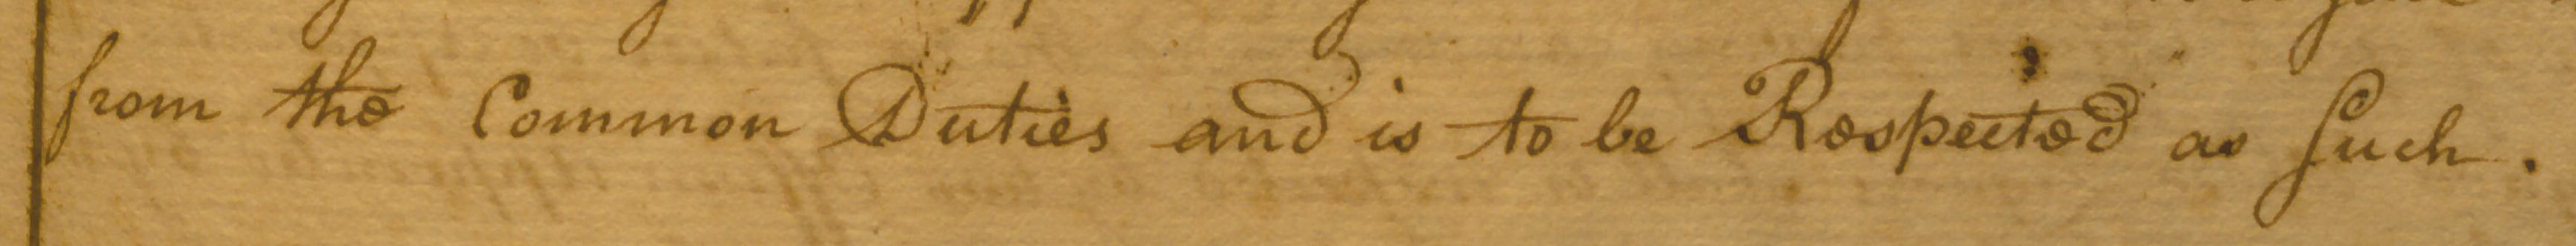from the common Duties and is to be Respected as such.
